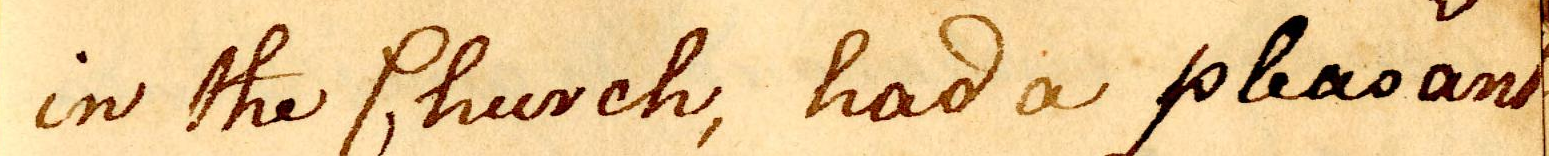in the Church, had a pleasant
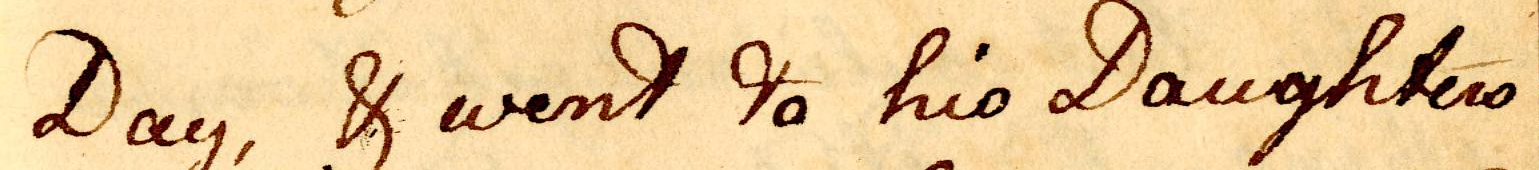Day, & went to his Daughters
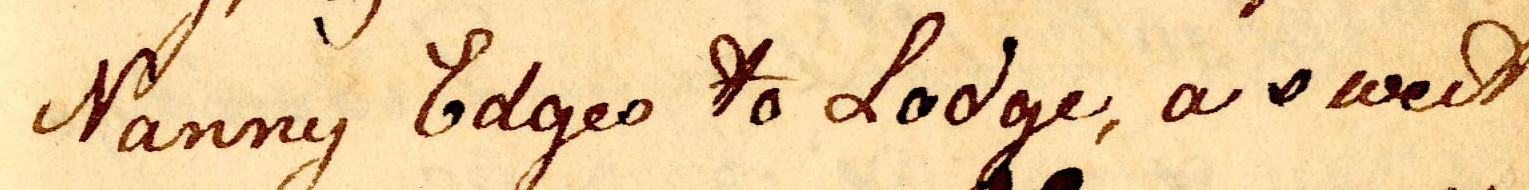Nanny Edges to Lodge, a sweet
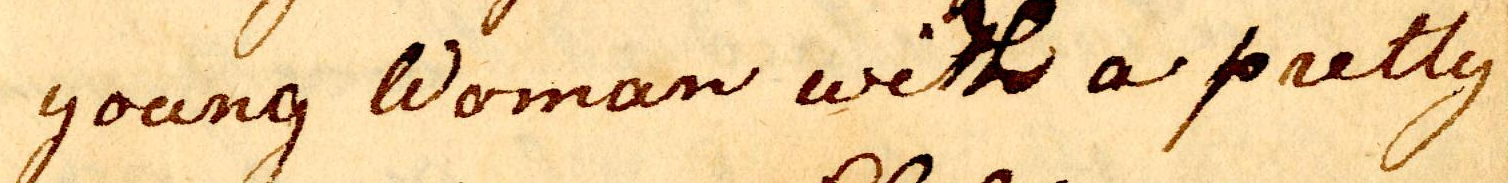young Woman with a pretty
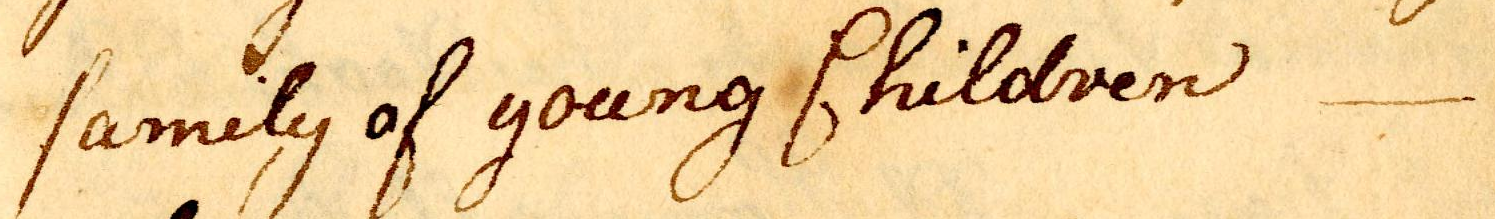family of young Children-
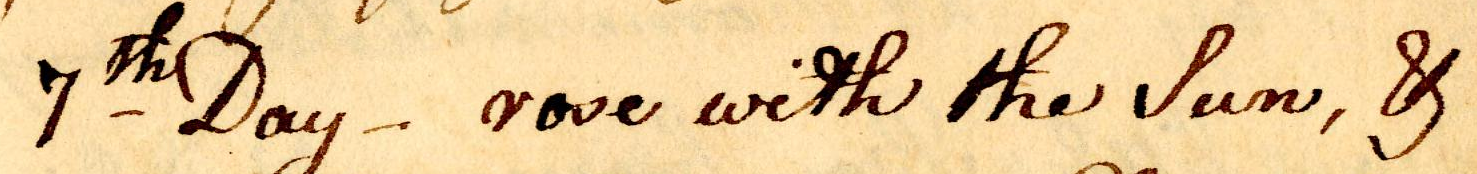7^th Day- rose with the Sun, &
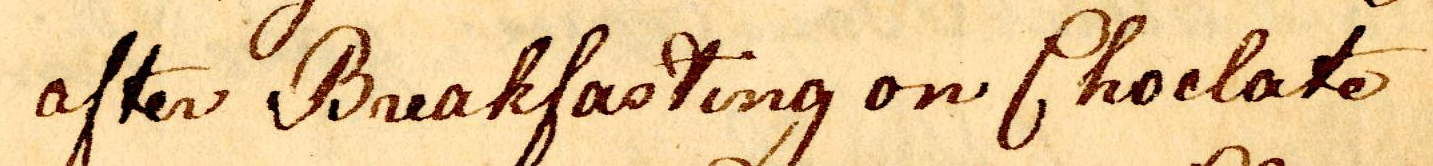after Breakfasting on Choclate
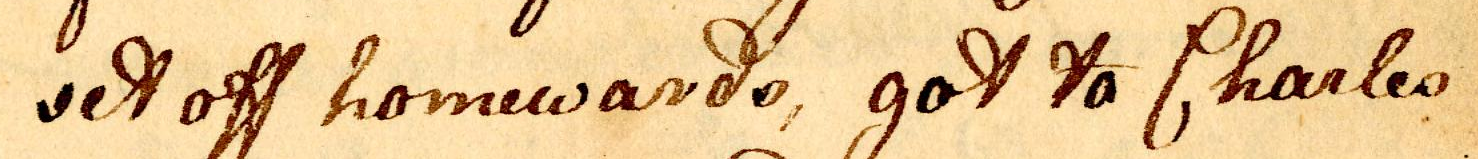set off homewards, got to Charles
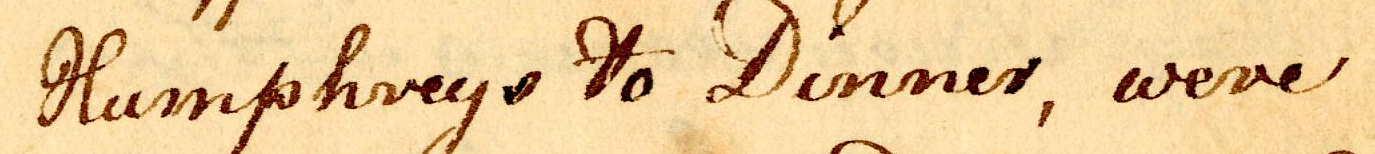Humphreys to Dinner, were
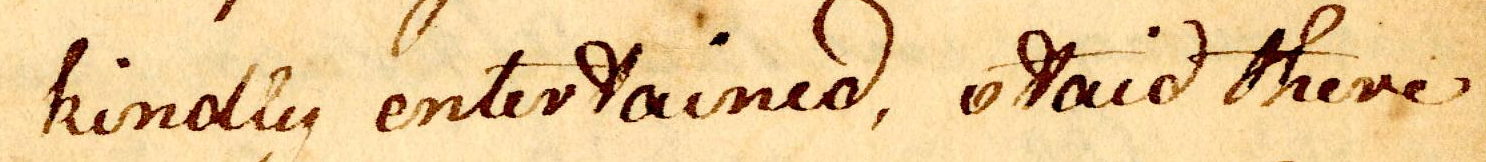kindly entertained, staid there
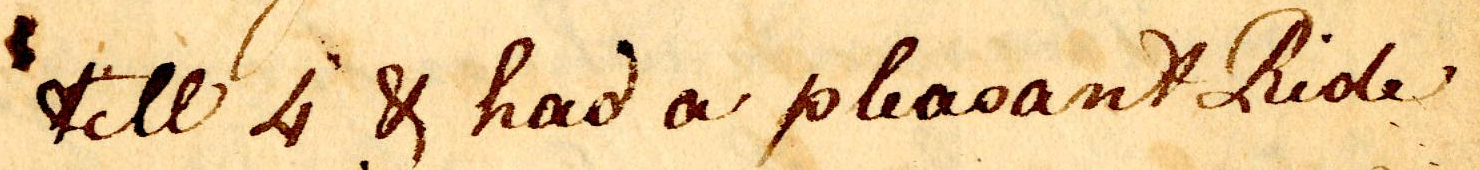till 4 & had a pleasant Ride
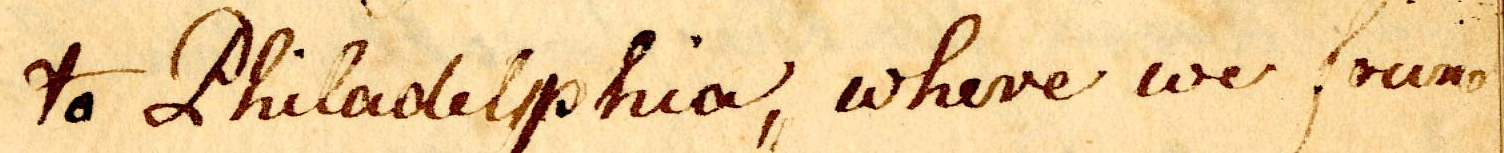to Philadelphia, where we found
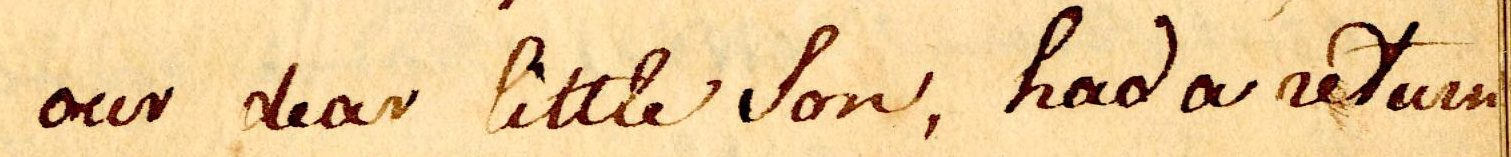our dear little Son, had a return
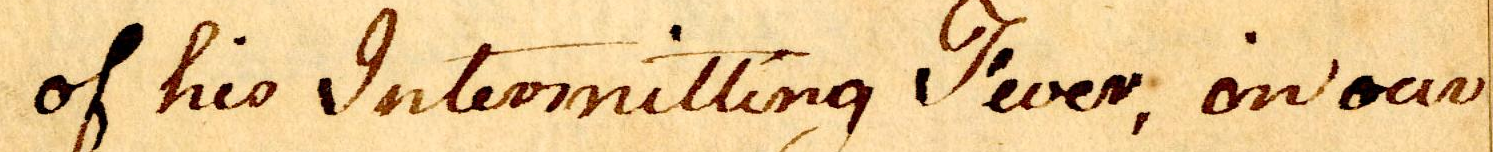of his Intermitting Fever, on our
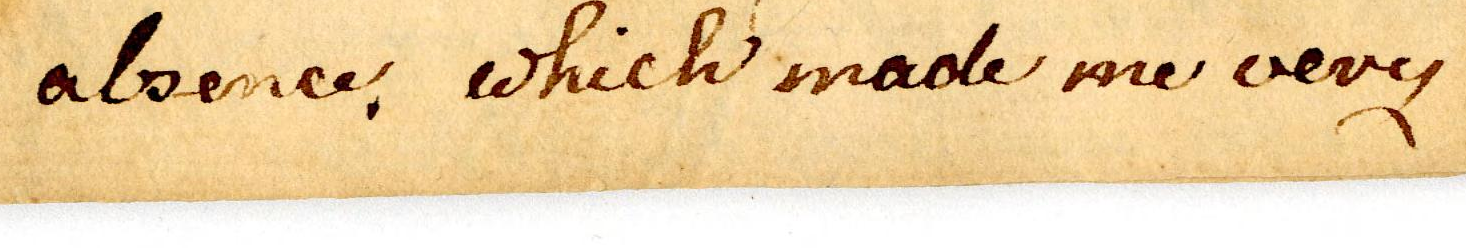absence, which made me very
